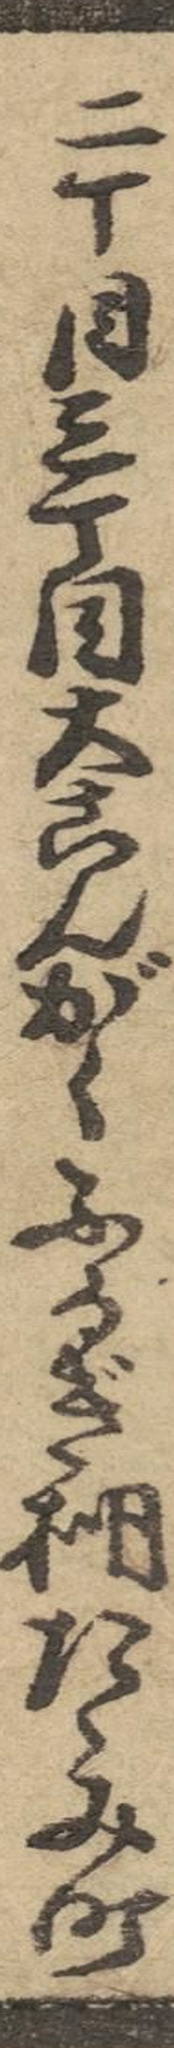二丁目三丁目大こんがしふかぎ棚たゝみ町
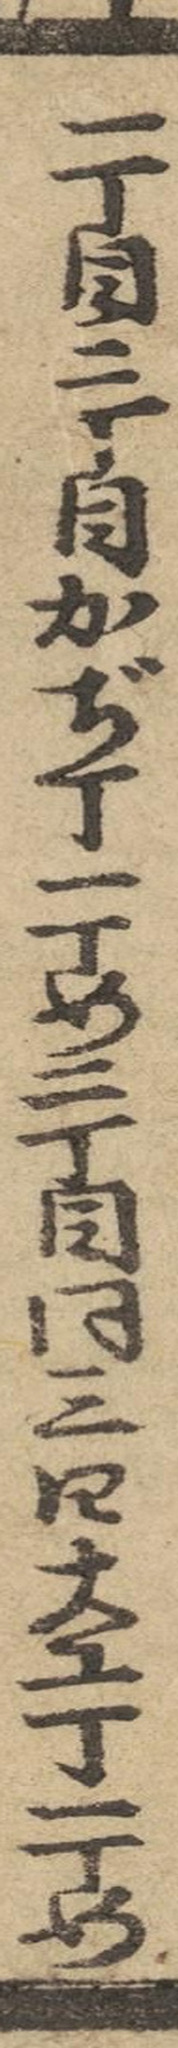一丁目二丁目かぢ丁一丁め二丁目同三四大工丁め
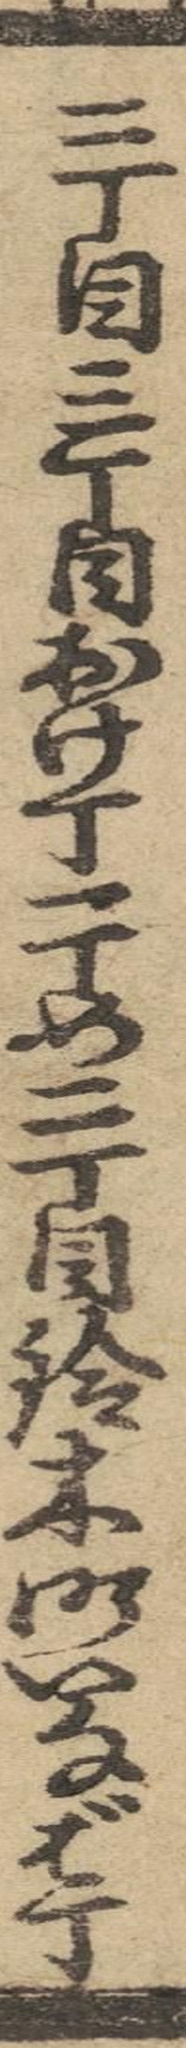二丁目三丁目おけ丁一丁め二丁目同鈴木町いなば丁
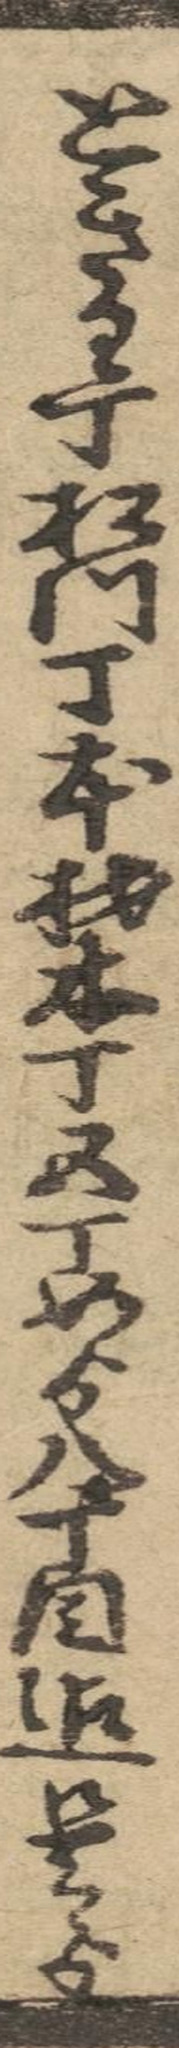ときわ丁松川丁本材木町五丁めゟ八丁目迄是ゟ
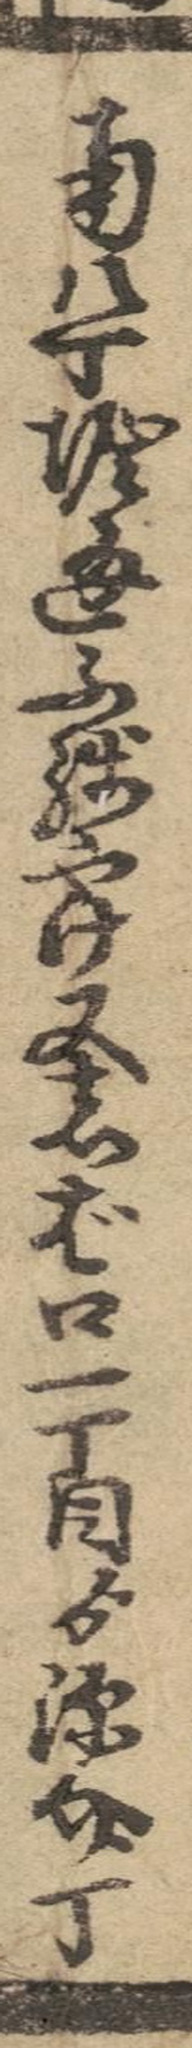南八丁堀通不残やけ又しば口一丁目ゟ源介丁
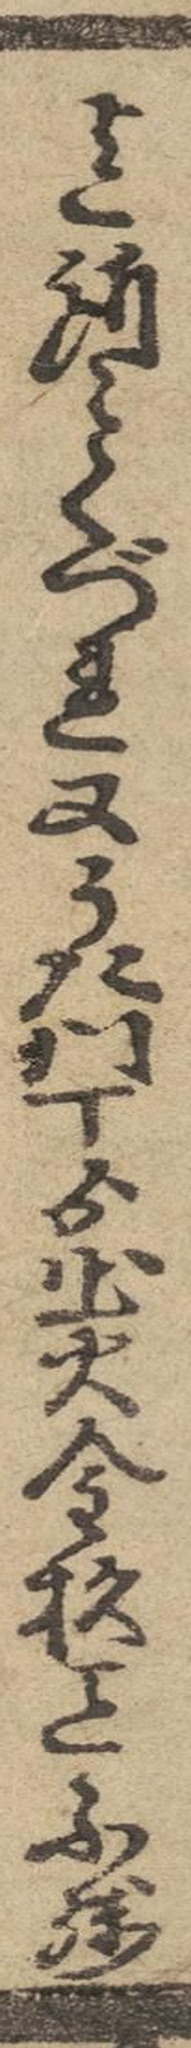迄所々くづれ又うた川丁ゟ出火金杉迄不残
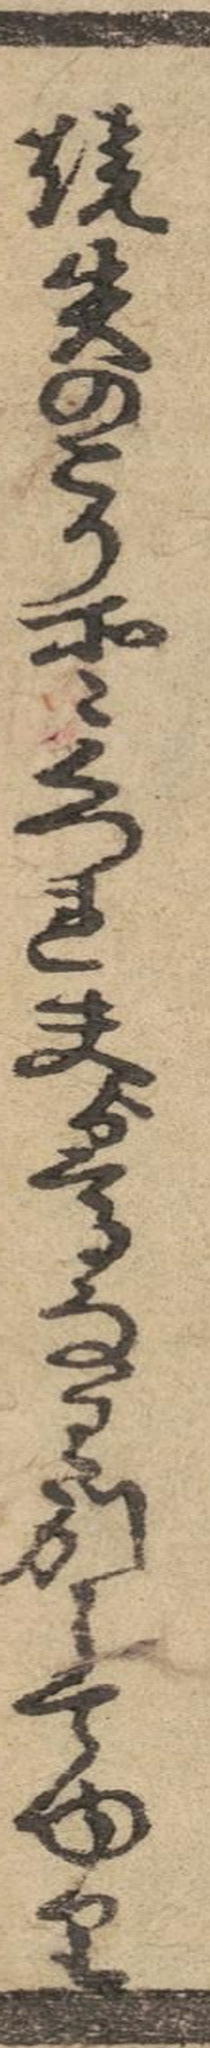焼失のこり所々くつれ夫ゟ高なわ別してゆり
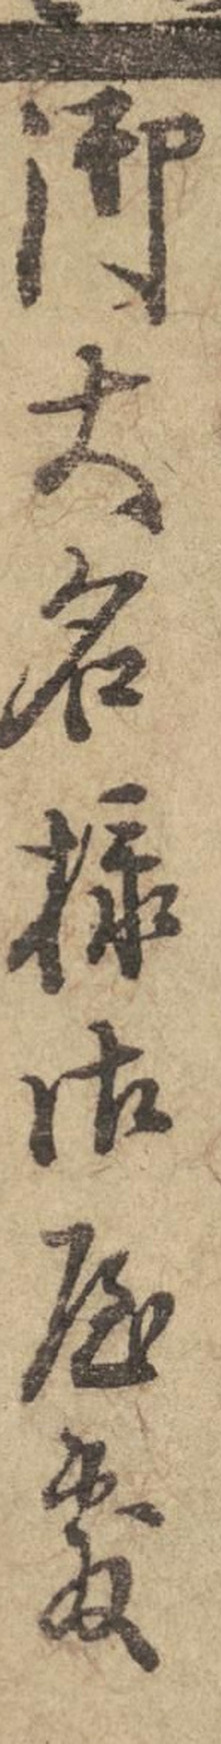御大名様御家敷
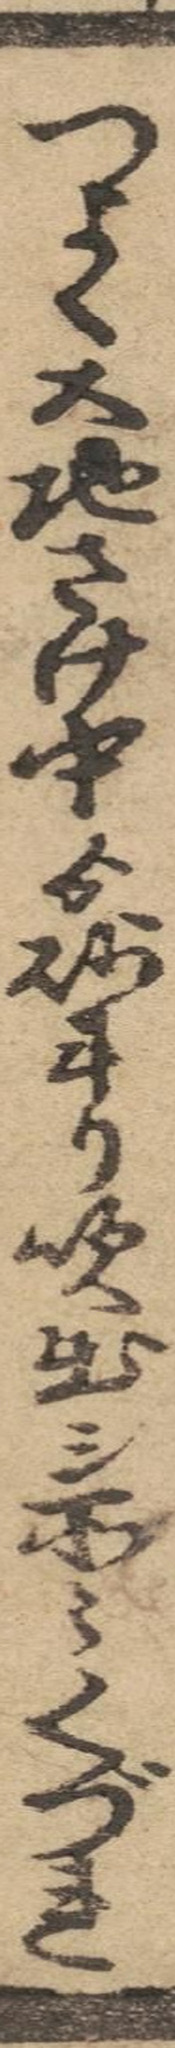つよく大地さけ中ゟ砂ほり吹出ㇱ所々くづれ
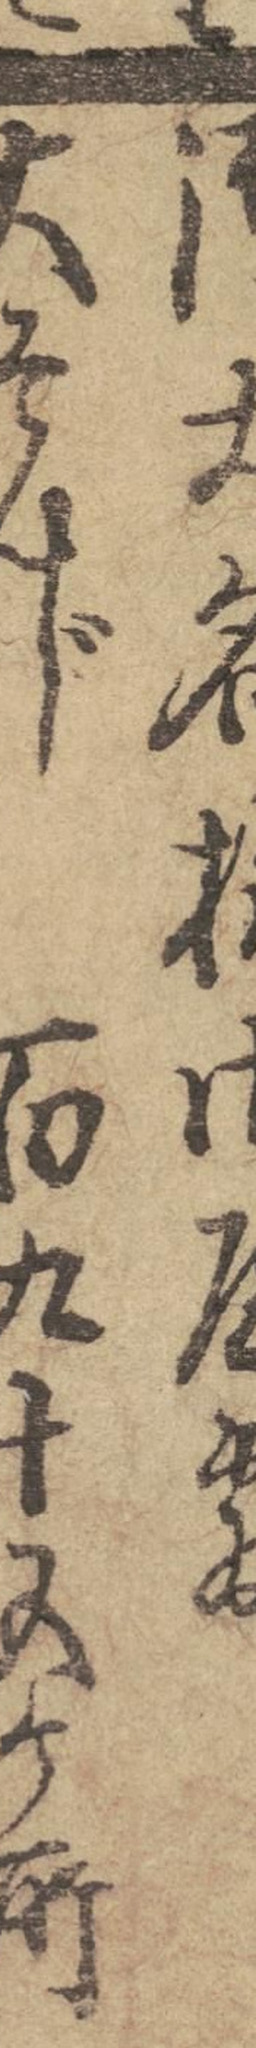大そんじ百九十五ヶ所
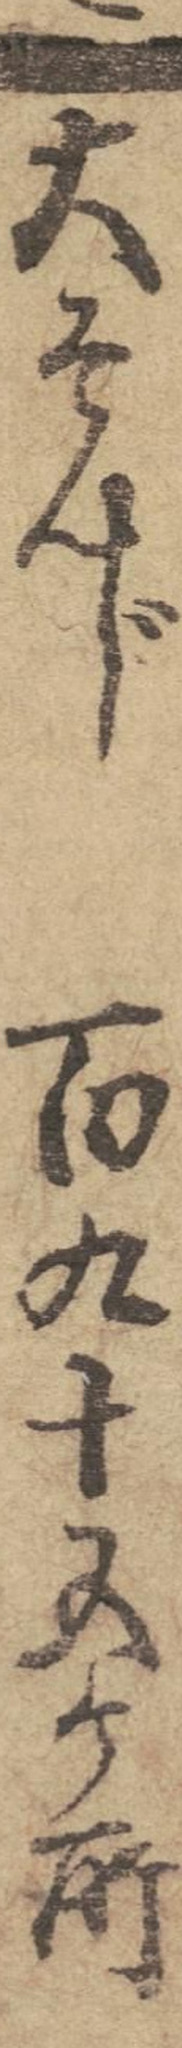大そんじ百九十五ヶ所
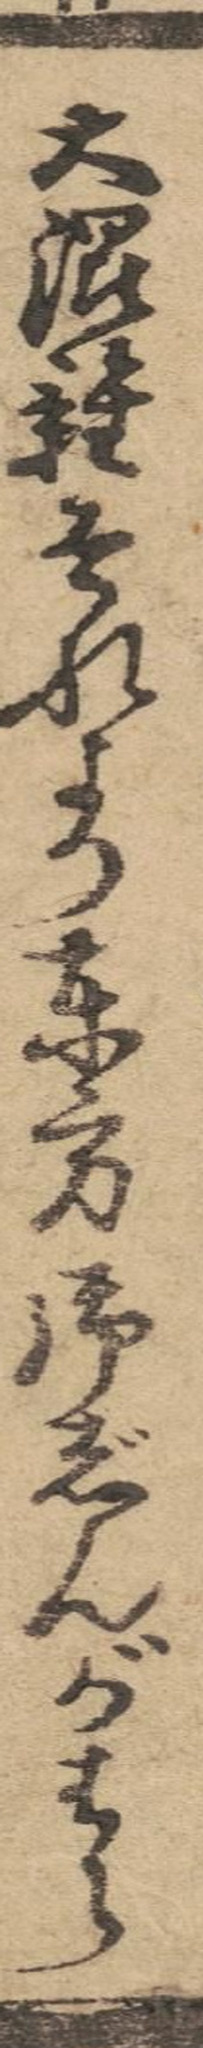大混雑それより東方御じんがはら
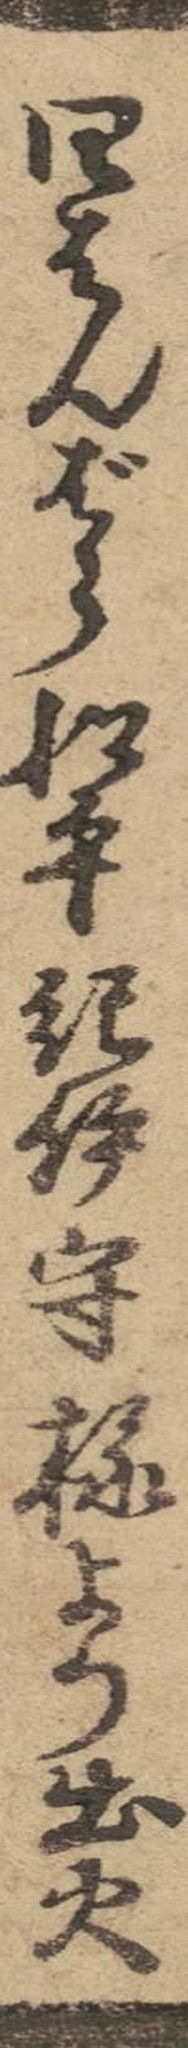四はんばう松平紀伊守様より出火
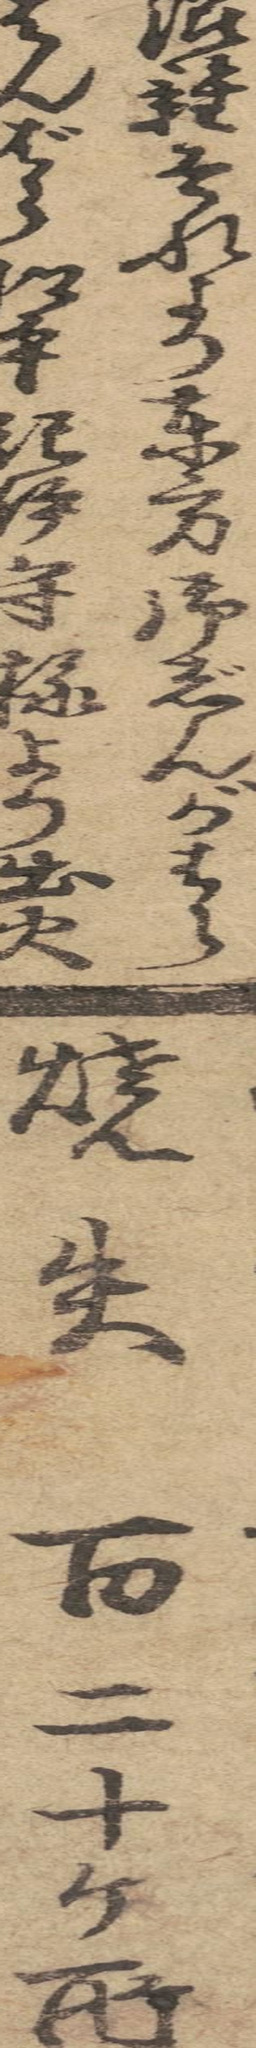四はんばう松平紀伊守様より出火
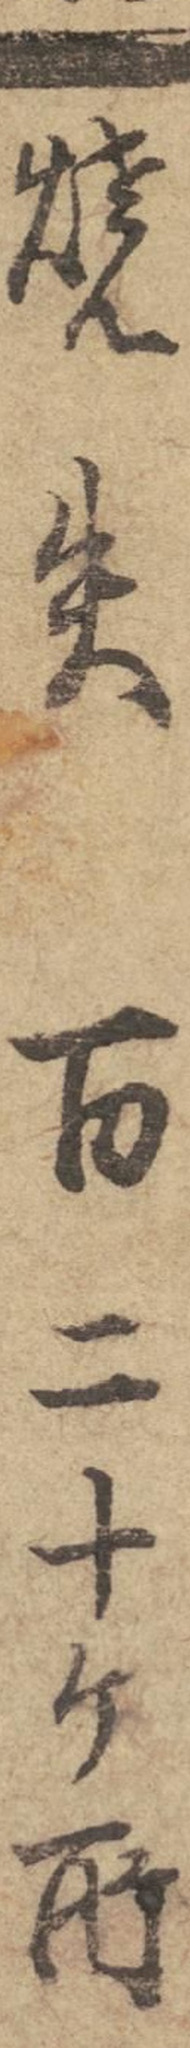焼失百二十ヶ所
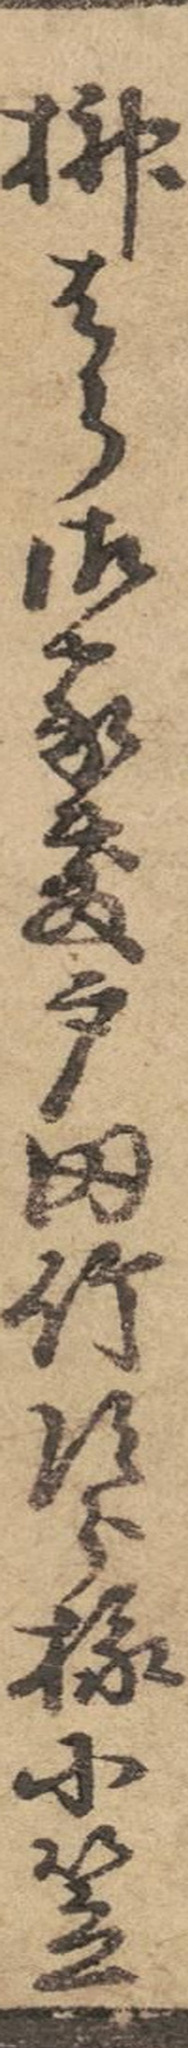榊はら御家敷戸田竹次郎様小笠
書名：安政二乙卯歳十月二日夜ル四ツ時震始メ末代
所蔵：東京大学地震研究所図書室 Earthquake Research Institute Library, The University of Tokyo, JAPAN
